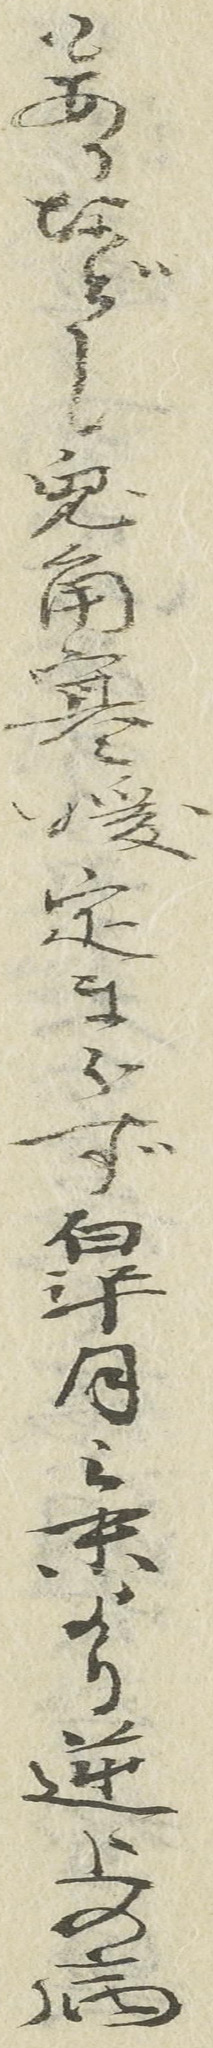もありなどし兎角寒暖定まらず皐月之末より逆上の病
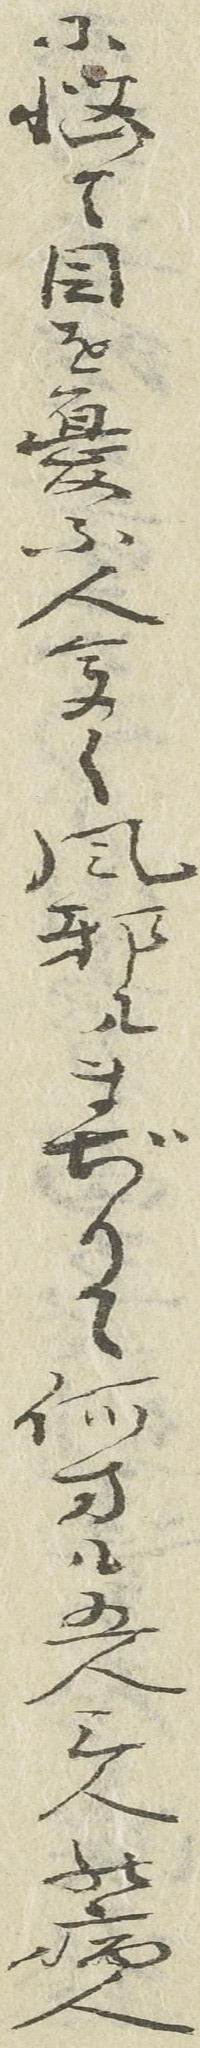に悩て目を憂ふ人多く風邪もまぢりて何方も五人三人此病人
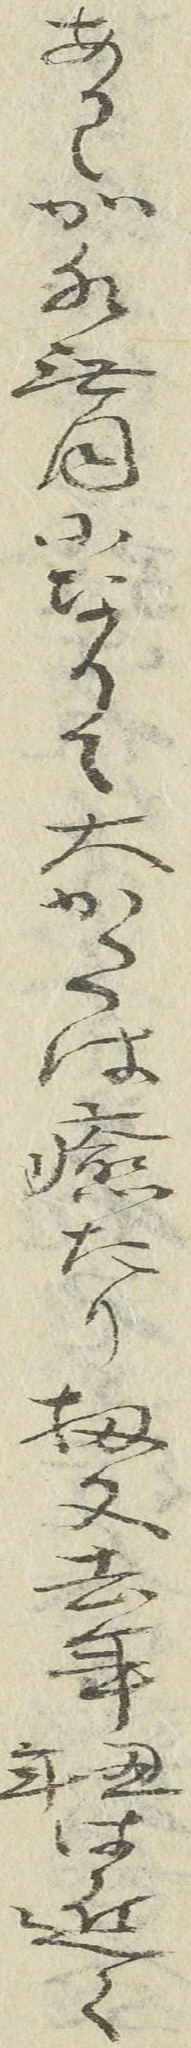ありしが水無月になりて大かたは癒たり扨又去年丑年は近く
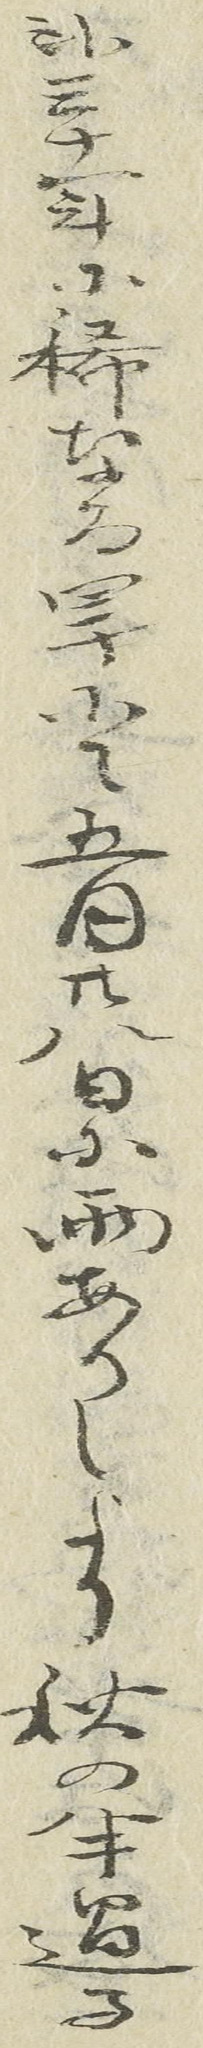弐三十年に稀なる旱にて五月廿八日に雨ありしより秋の半過る
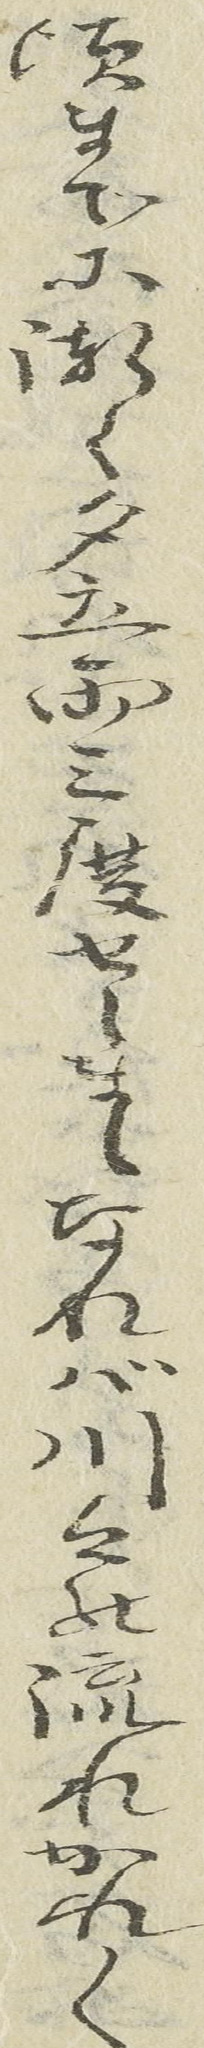頃までに漸く夕立雨三度せしましなれば川々の流れかれ〳〵
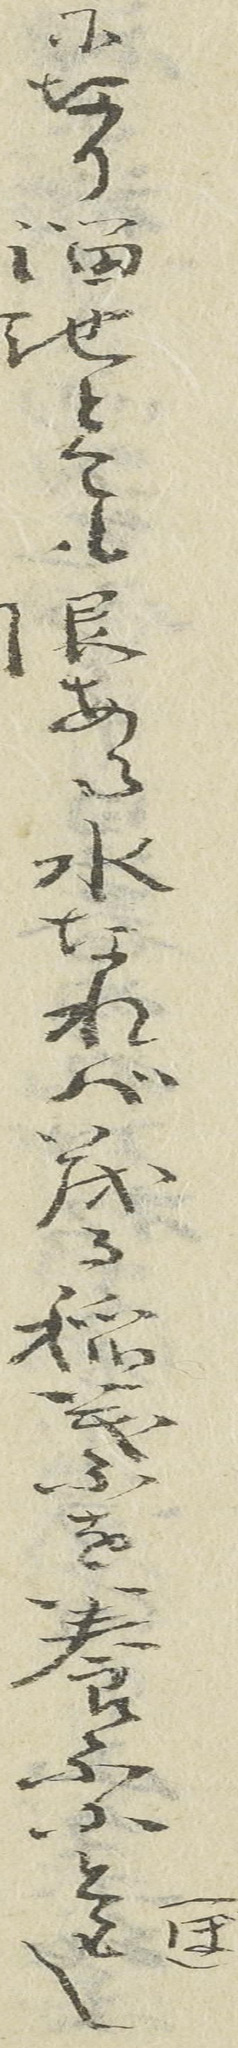になり溜池とても限ある水なれば茂る稲葉を養ふにともし

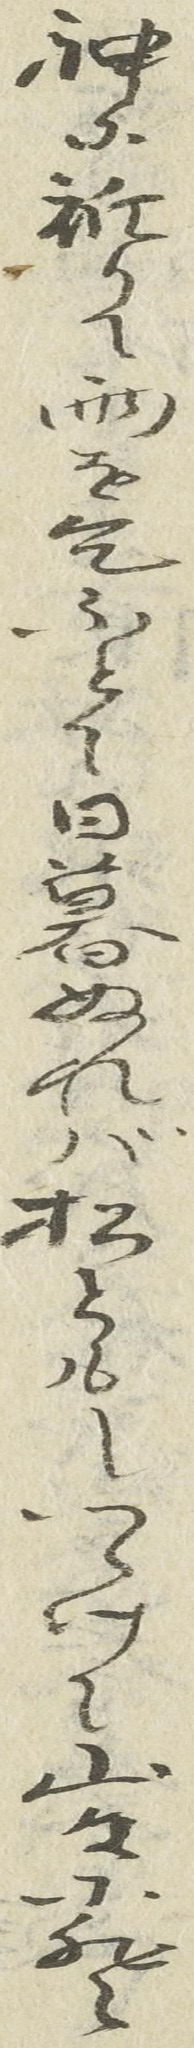神に祈りて雨を乞ふとて日暮ぬれば松ともしつゝけて山々に登
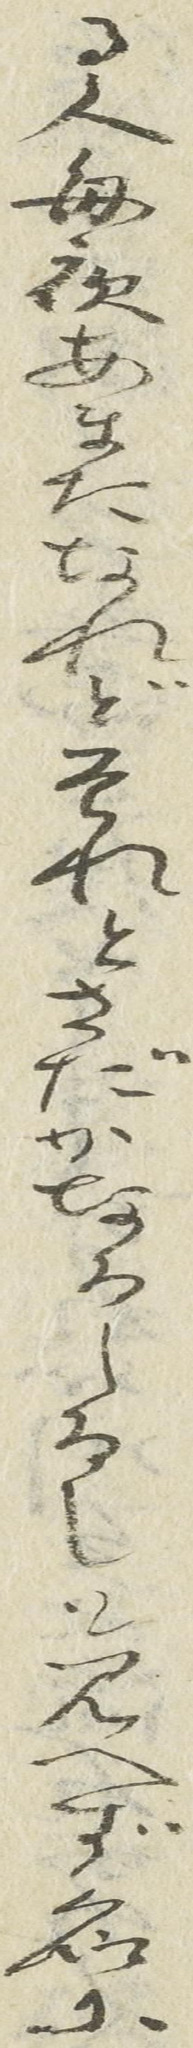る人毎夜あまたなれどそれとさだかなるしるしも見へず名に
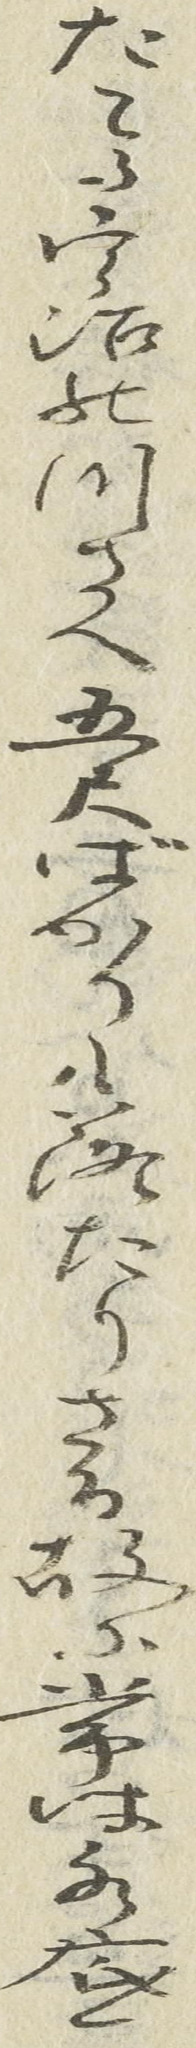たてる宇治の川さへ五尺ばかりも落たりさる故に常は水底
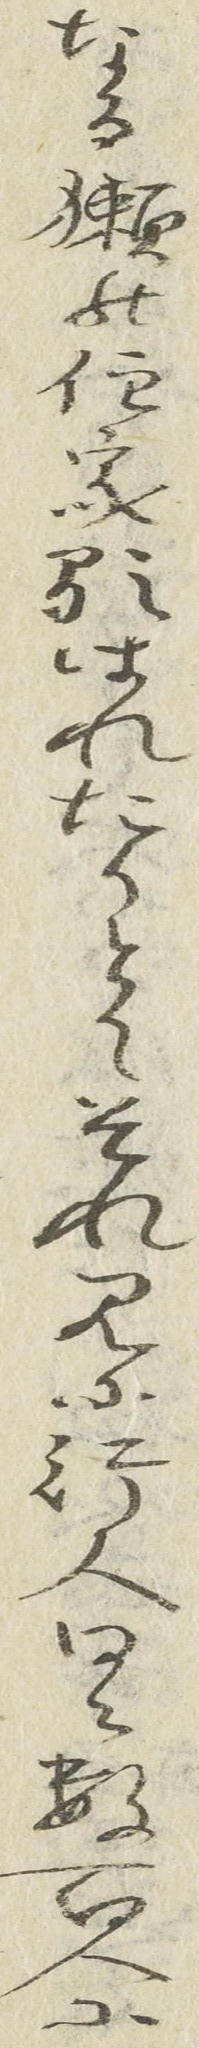なる獺の住家顕はれたりとてそれ見に行人日々数百人に
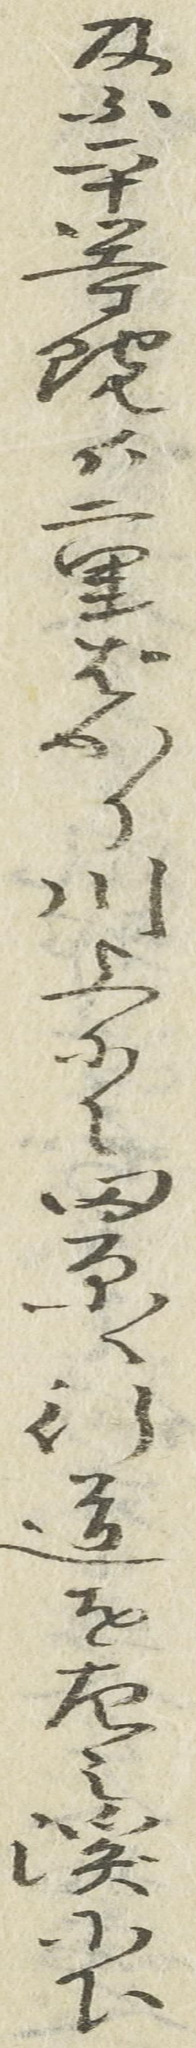及ふ平等院ゟ二里ばかり川上にて田原へ行道を左之渓に下
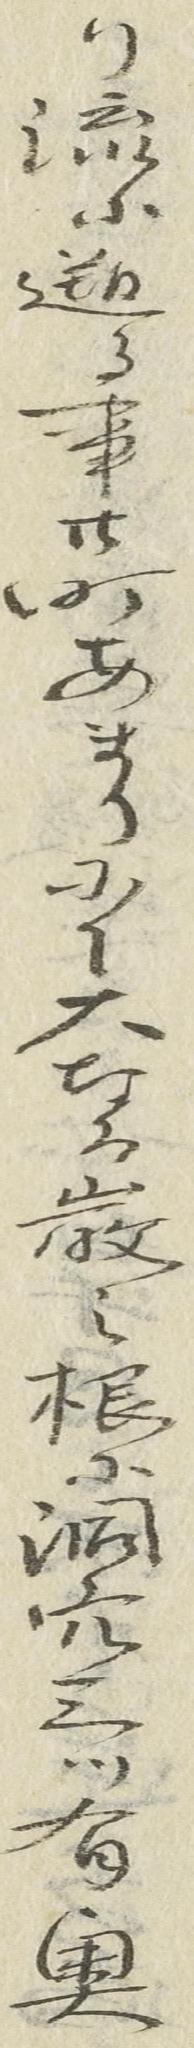り流に遡る事廿町あまりにて大なる巌之根に洞穴三ツ有奥
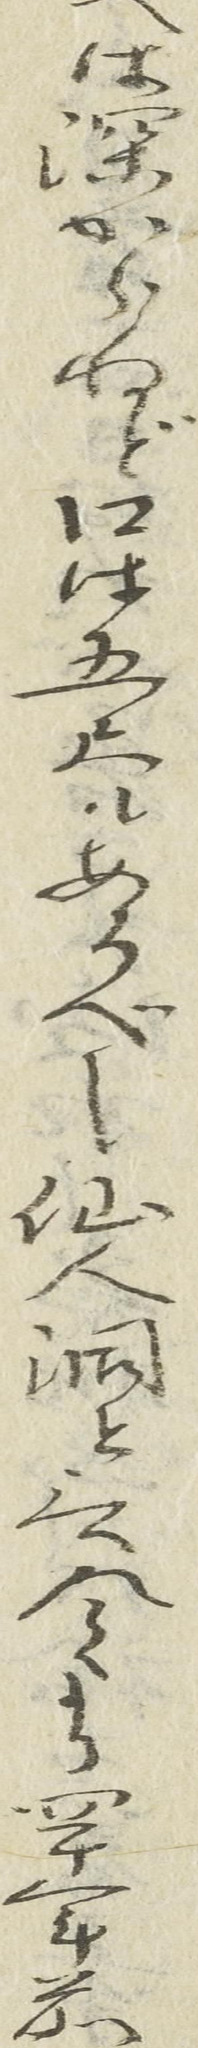へは深からねど口は五尺あるべし仙人洞と云今より四ヶ年前
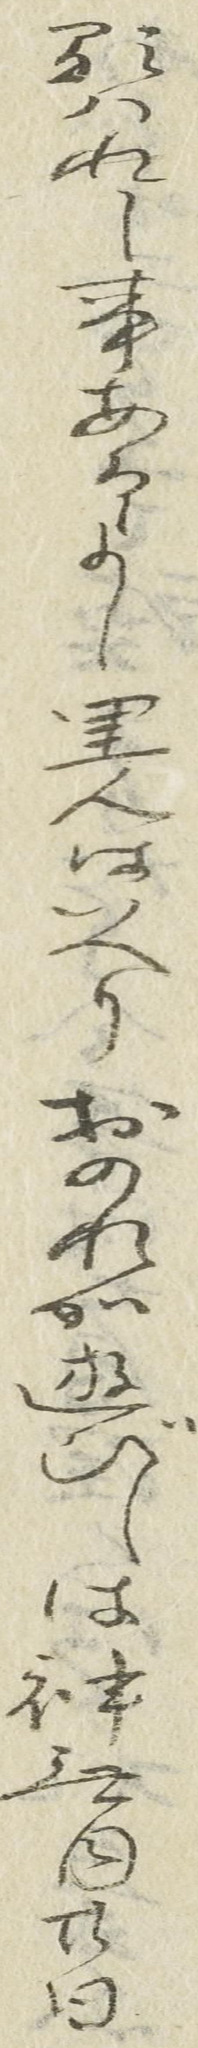顕はれし事あるよし里人はいへりおのれが遊びしは神無月廿日
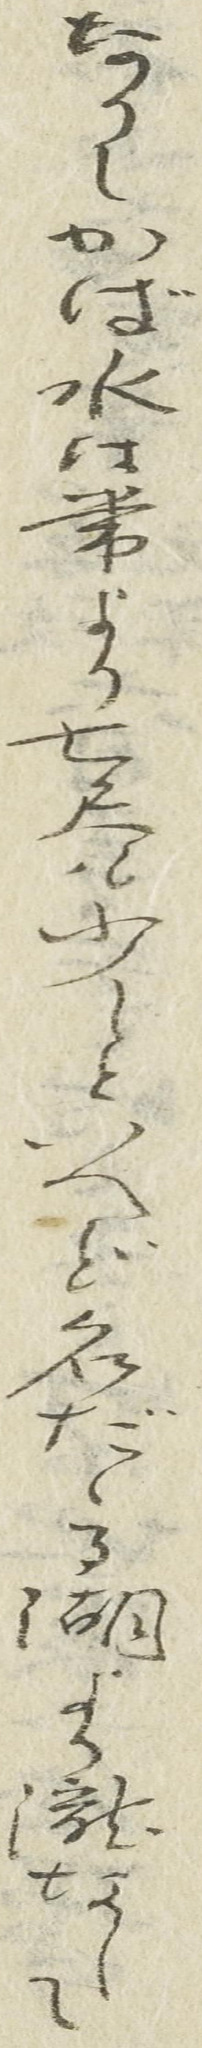なりしかば水は常より七尺も少しといへど名だゝる湖より瀧なして
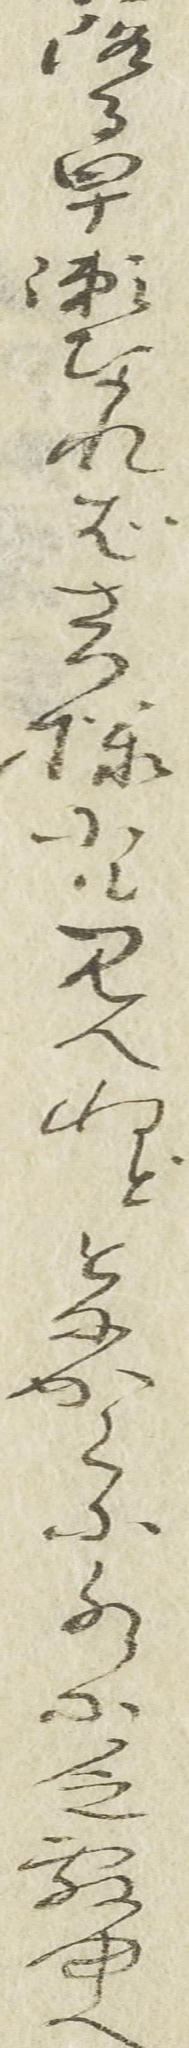落る早瀬なればさる様にも見へねどとにかくに水に乏敷ゆへ
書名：地震前兆集　全
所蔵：東京大学地震研究所図書室 Earthquake Research Institute Library, The University of Tokyo, JAPAN
